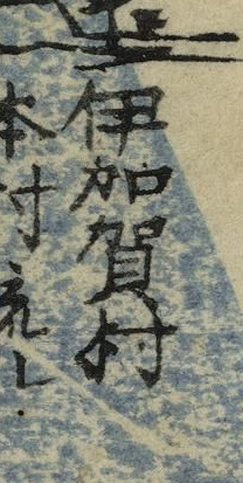伊加賀村
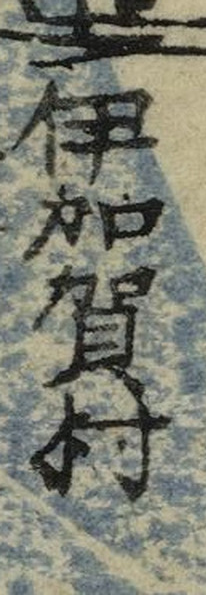伊加賀村
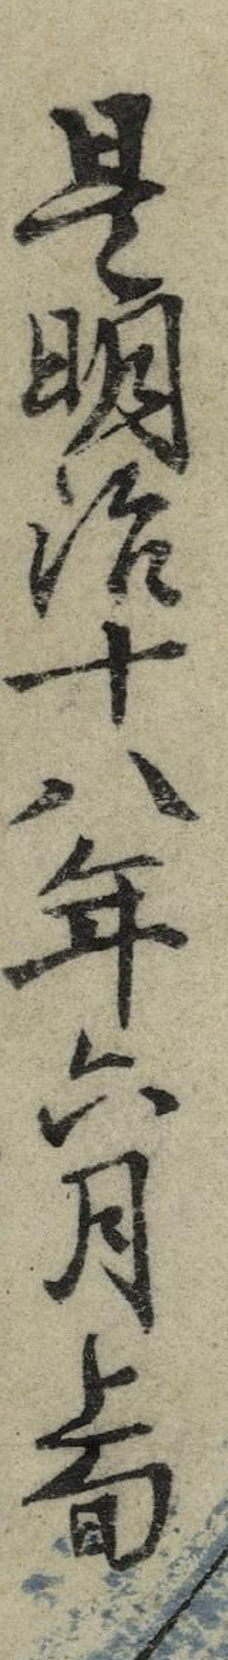是明治十八年六月上旬
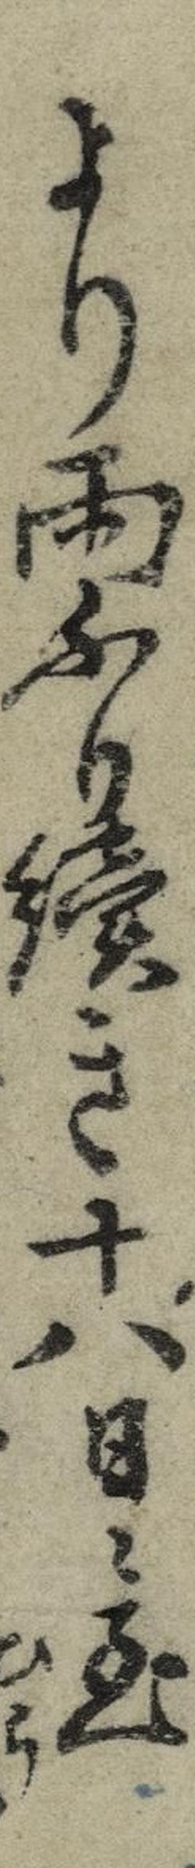より雨ふり続き十八日ニ至
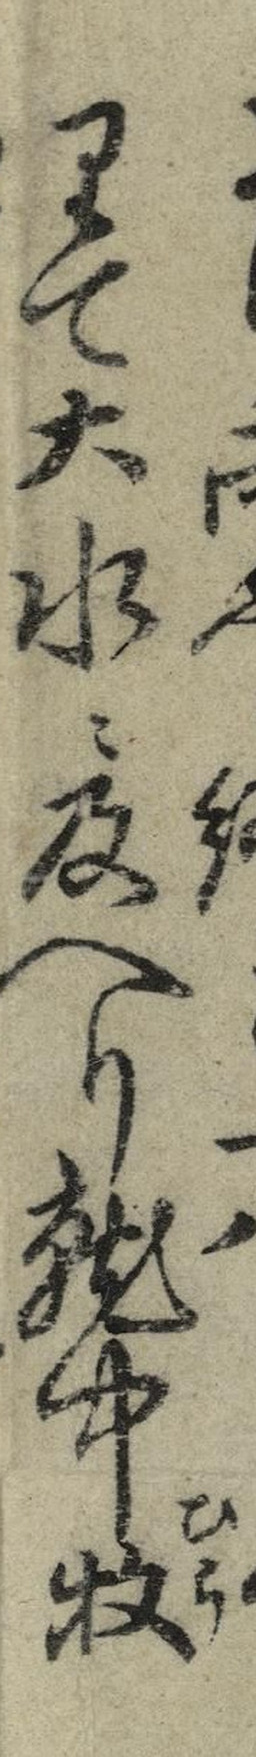りて大水に及へり就中枚
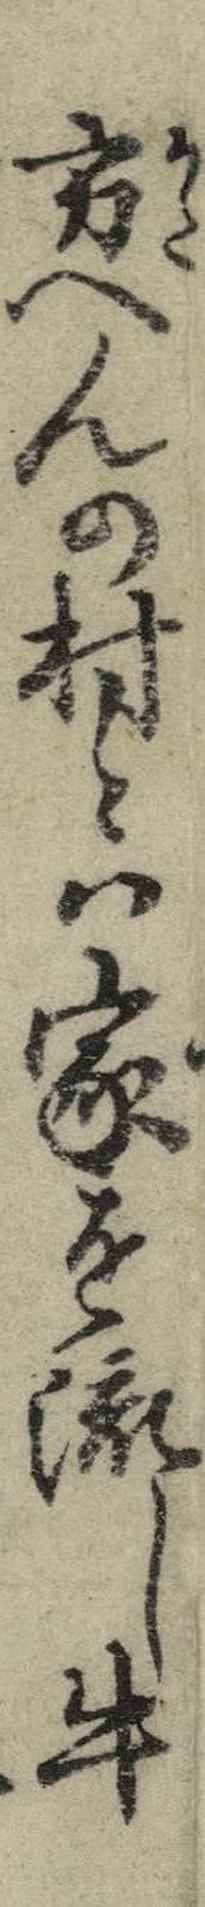方へんの村〻は家を流し牛
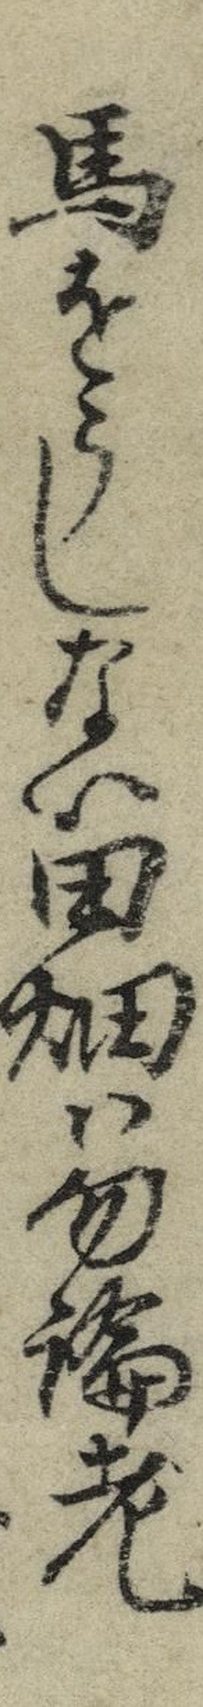馬をうしない田畑は勿論老
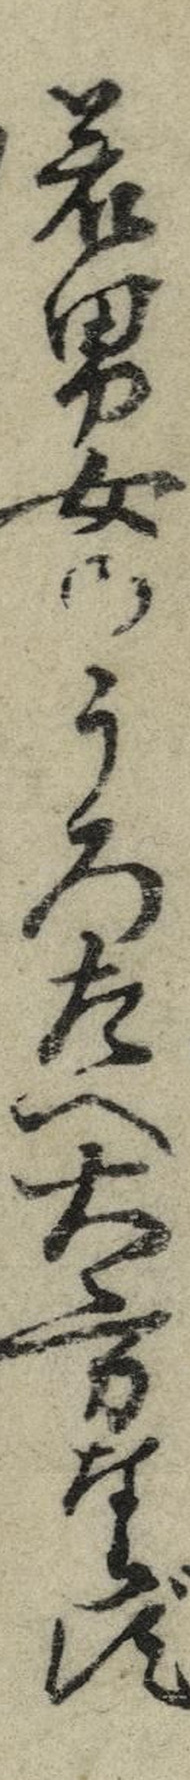若男女のうろたへ大方ならず
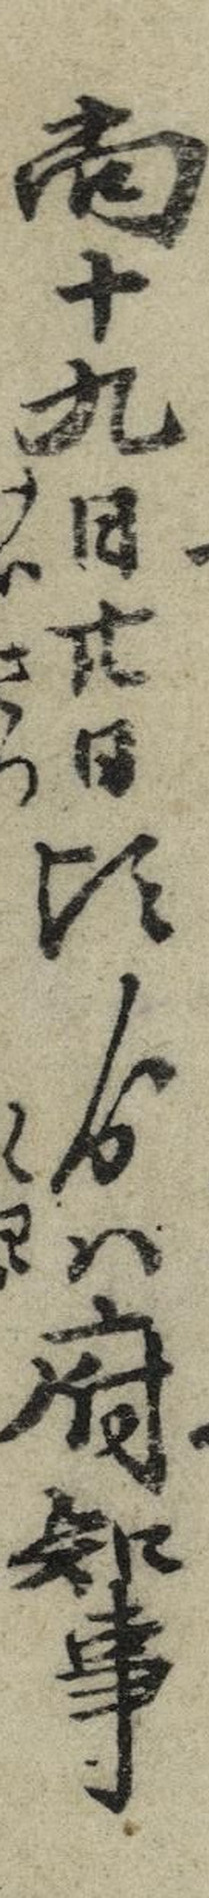尚十九日廿日頃ゟは府知事
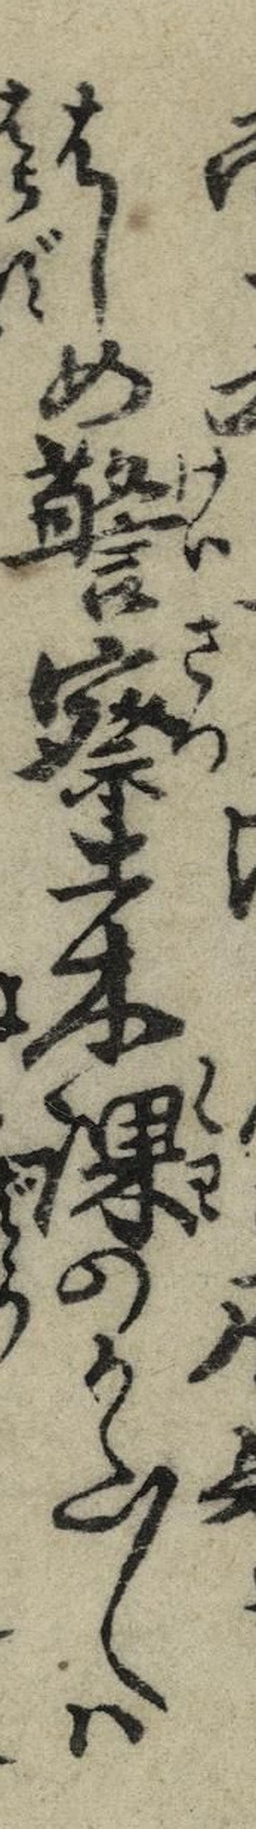はじめ警察土木課のかた〳〵は
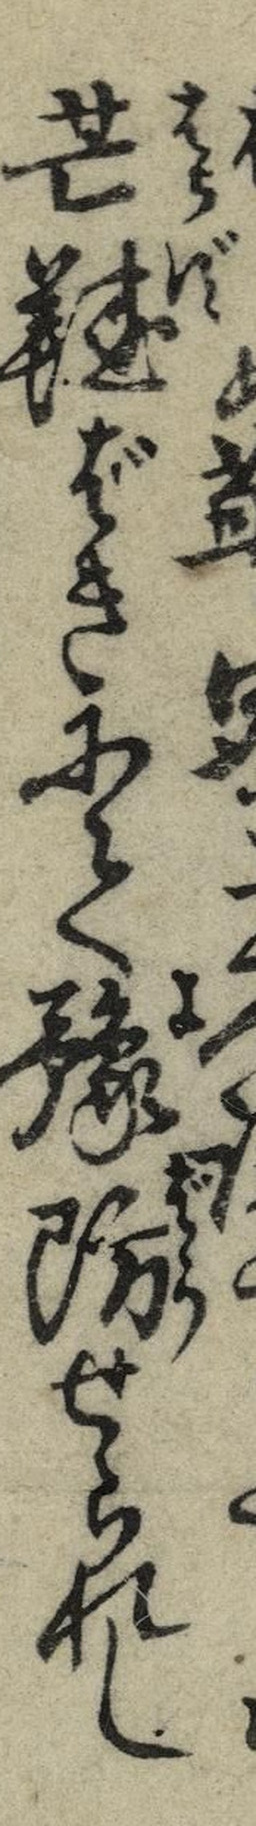芒鞋ばきにて予防せられし
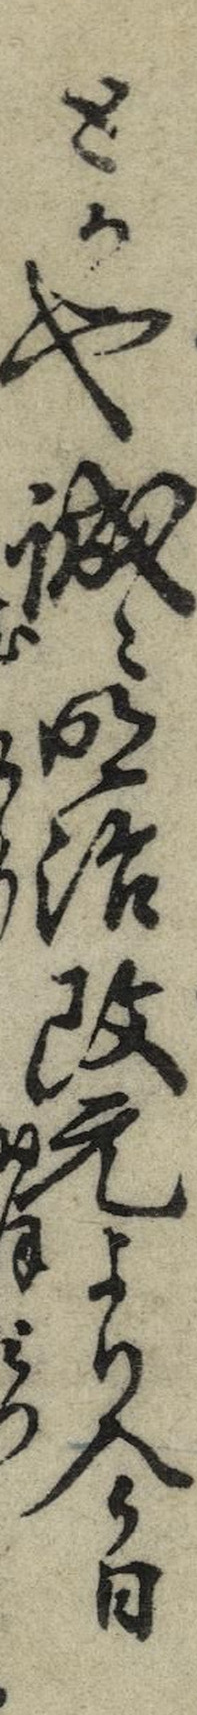とかや誠ニ明治改元より今日
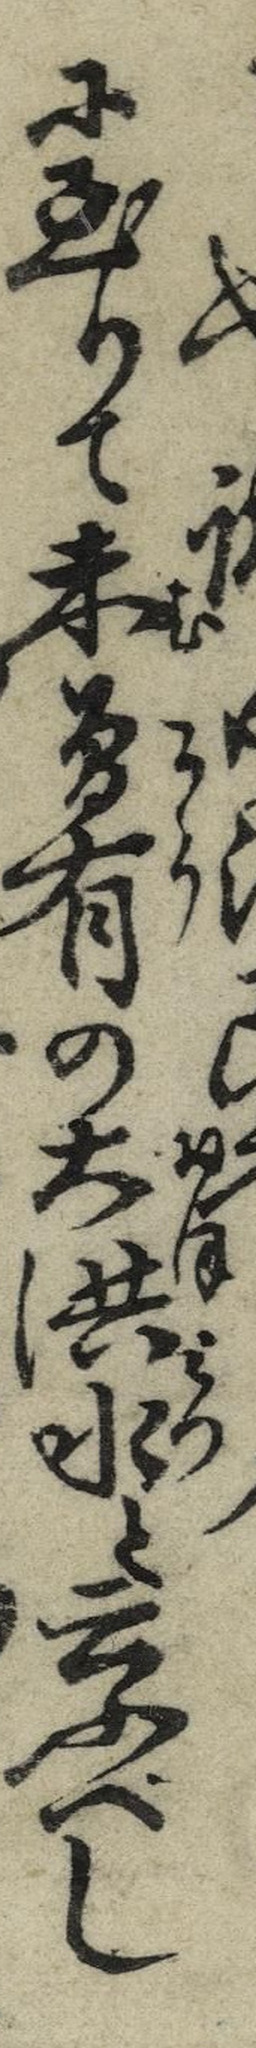に至りて未曾有の大洪水と云ふべし
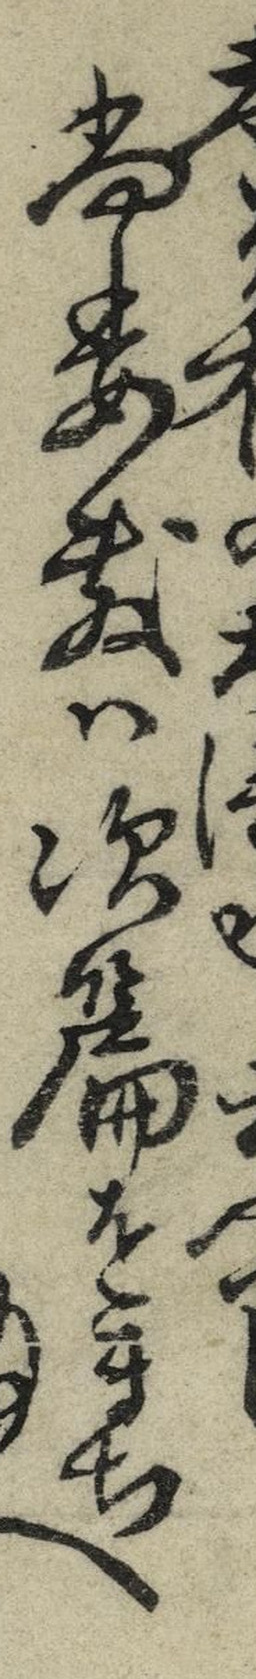尚委敷は次篇をまち
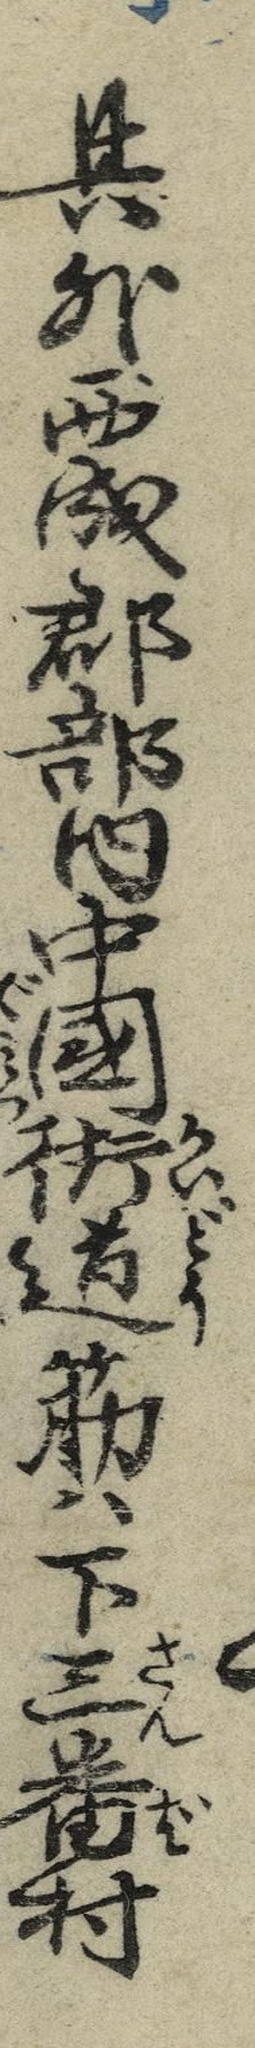其外西成郡部内中国街道筋は下三番村
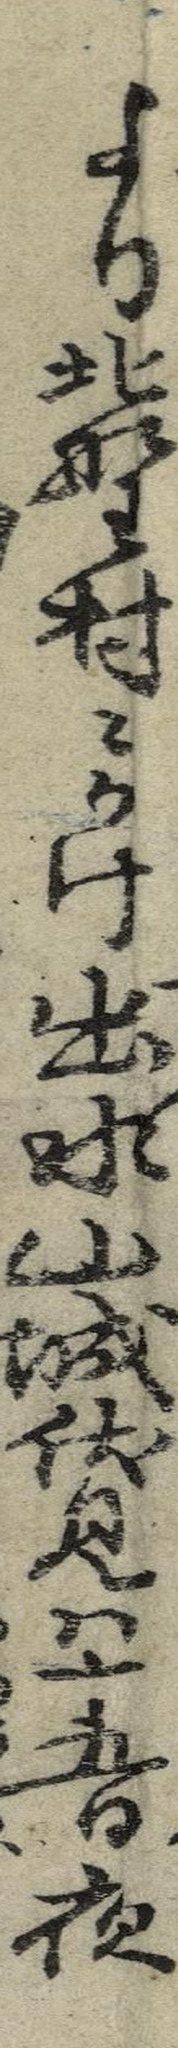より北野村にかけ出水山城伏見は十五日夜
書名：河内摂津大水のうわさ
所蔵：東京大学地震研究所図書室 Earthquake Research Institute Library, The University of Tokyo, JAPAN
